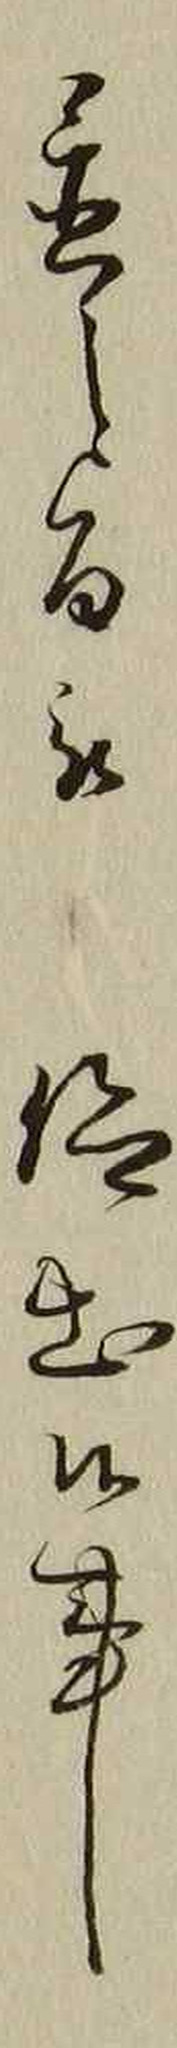置の旨被仰出候事
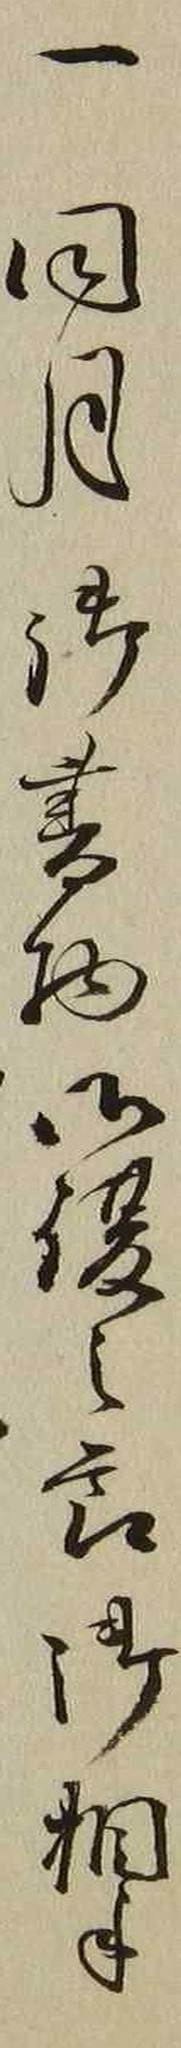一同月御書物御復の節御相手
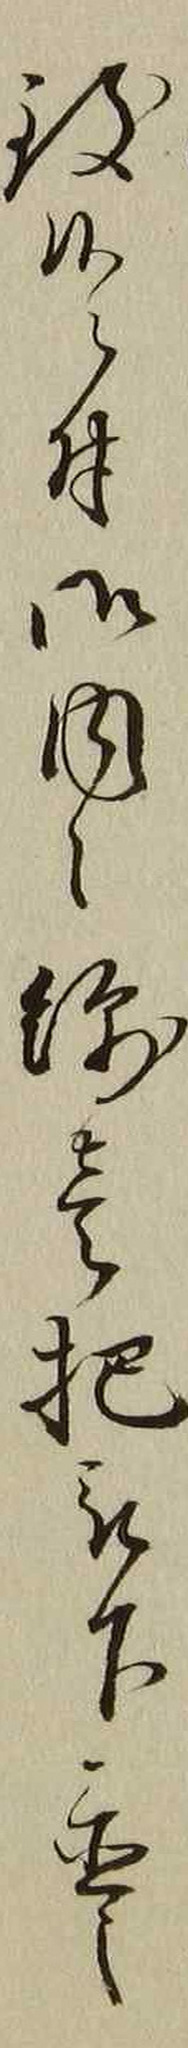致候に付御内々綿壱把被下置の
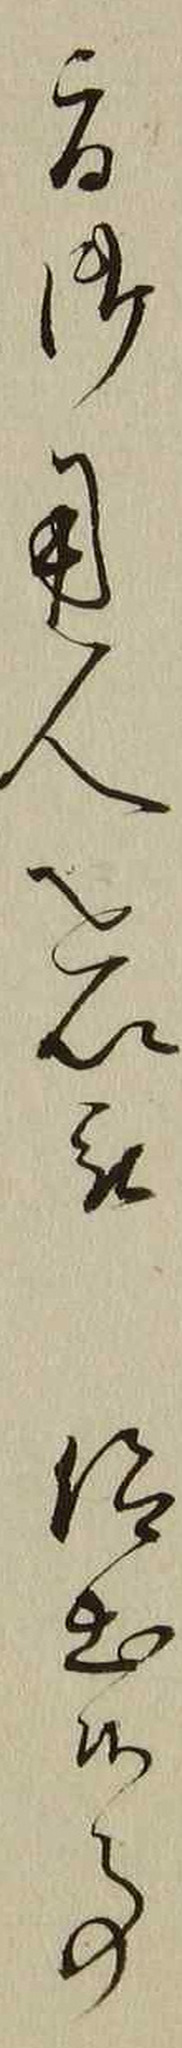旨御用人を以被仰出候事
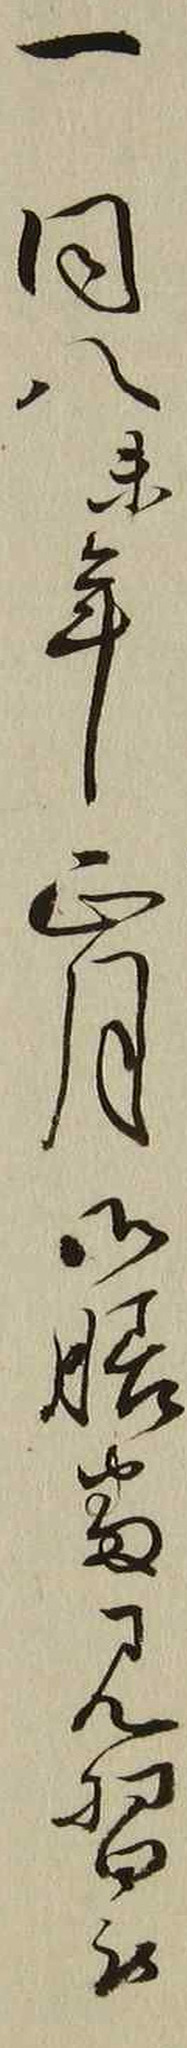一同八未年正月御膳番見習被
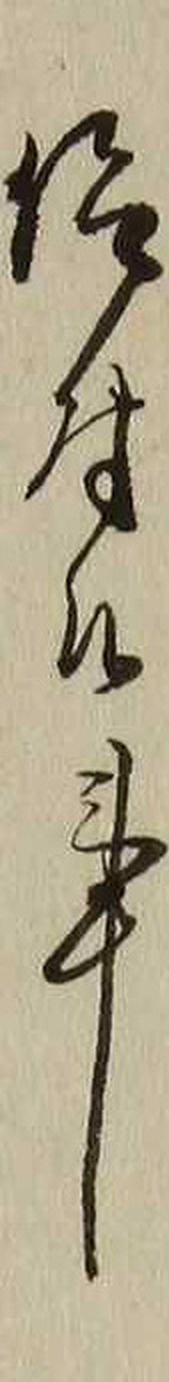仰付候事
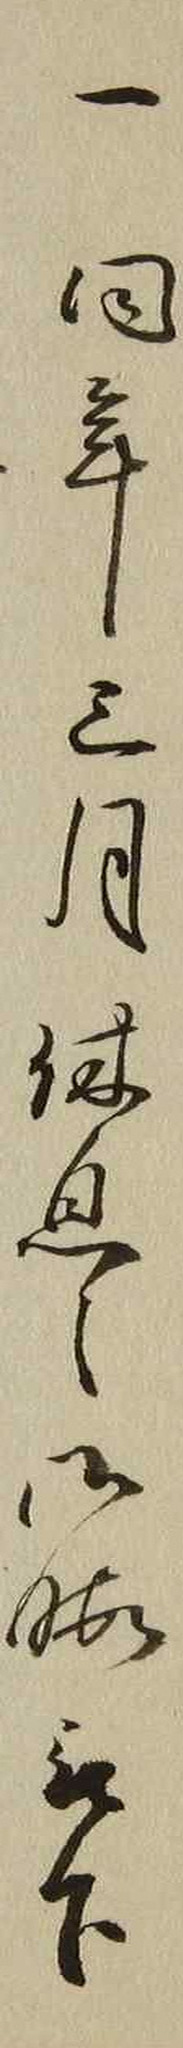一同年三月休息の御暇被下
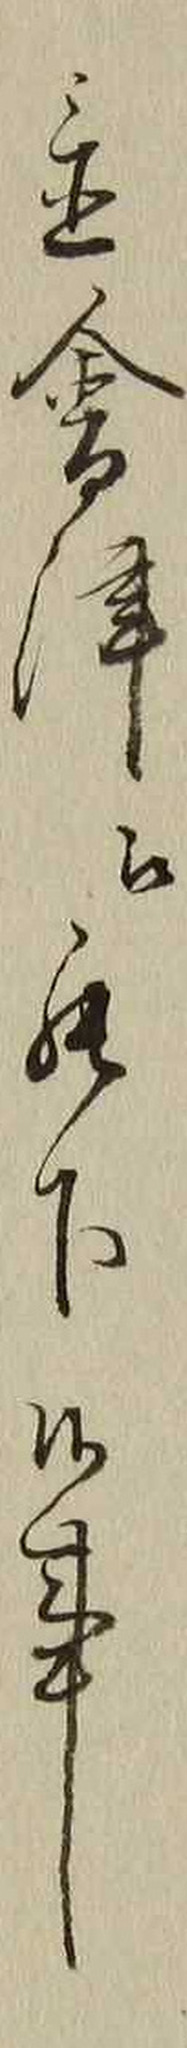置会津江罷下候事
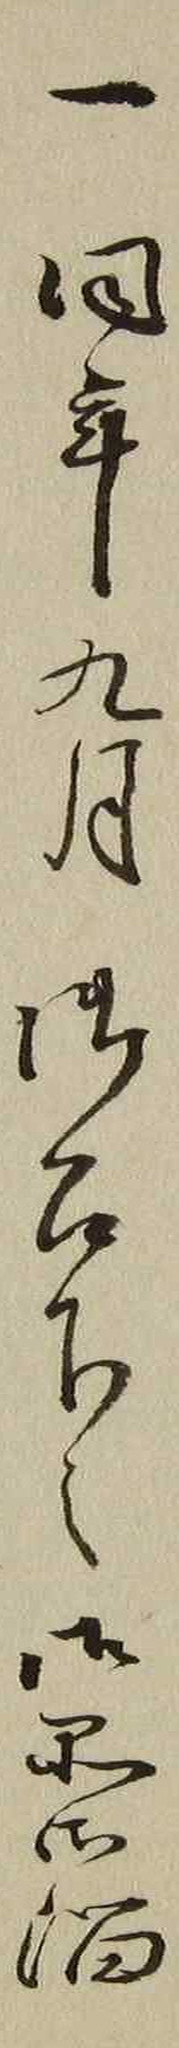一同年九月御召下の御品御溜
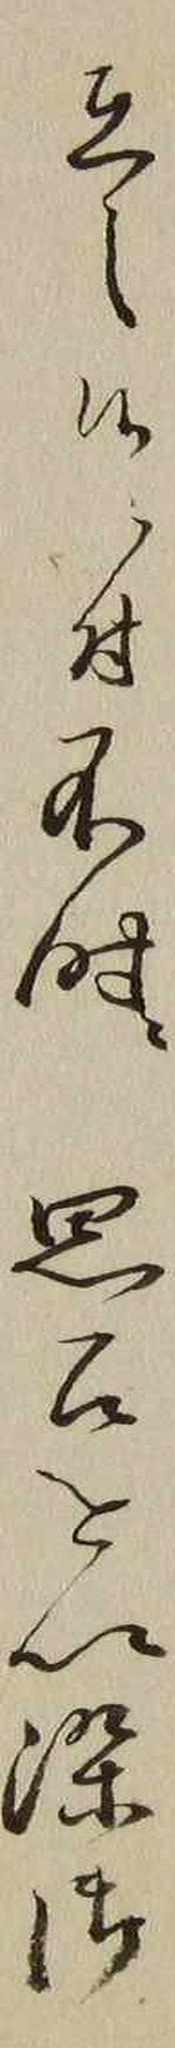在之候に付不時に思召を以染御
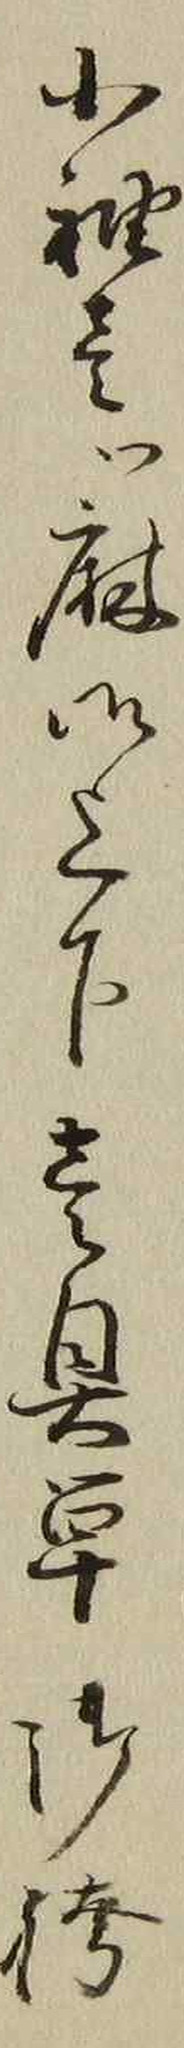小袖壱ツ麻御上下壱具単御袴
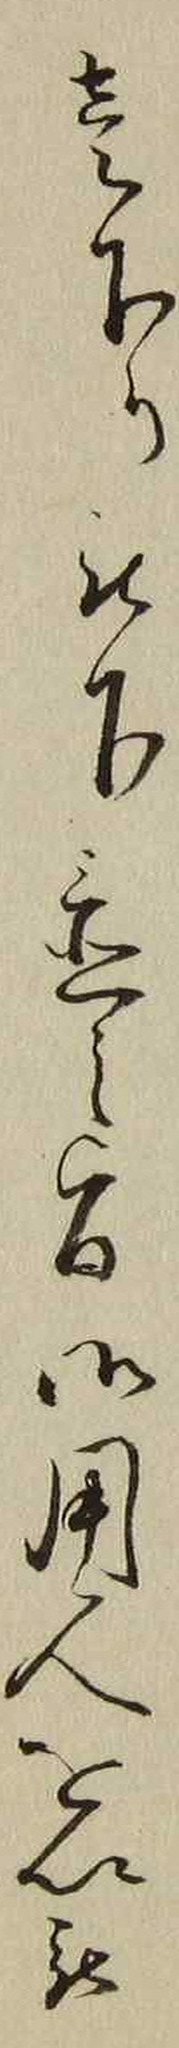壱下り被下置の旨御用人を以被
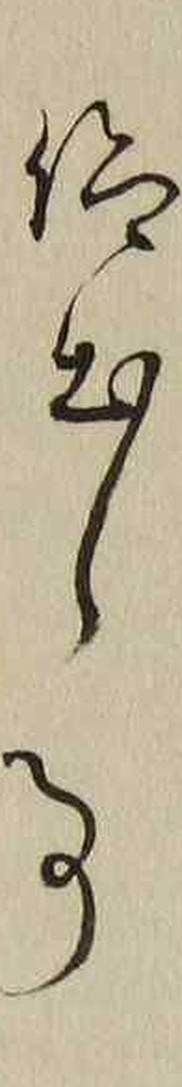仰出候事
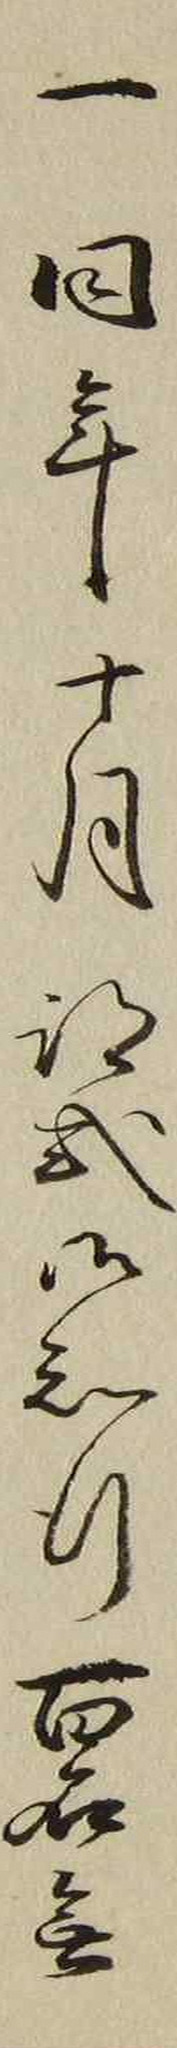一同年十月跡式御知行百石無
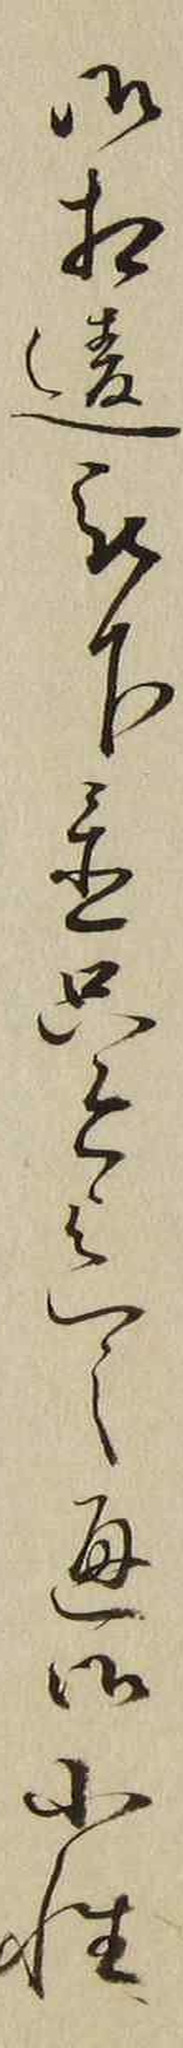御相違被下置只是迄の通御小姓

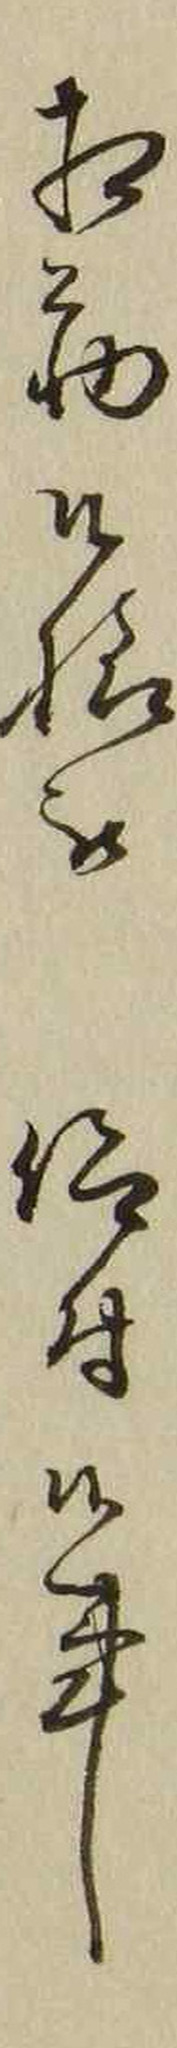相勤候様被仰付候事
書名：諸士系譜　巻之1　い之部1
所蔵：会津若松市立会津図書館
